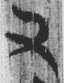又
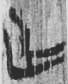亡（無）
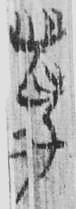○（一）
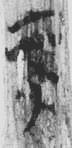天
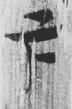下
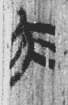亦
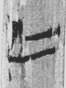亡（無）
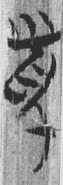○（一）
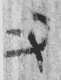又（有）
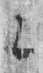丨
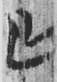亡
